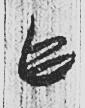𠂤
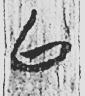㠯（以）
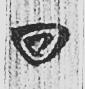回
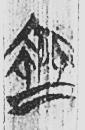齊
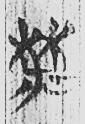焚
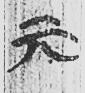亓
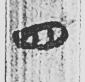四
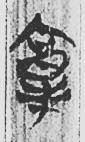𩫏
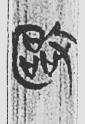毆
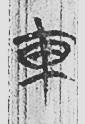車
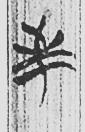{至于}
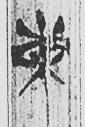東
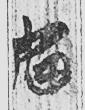{母田}
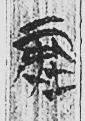坪
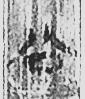公
